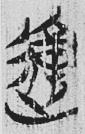○（就）
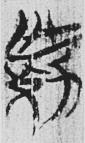○（死）
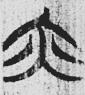亦
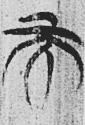天
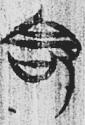命
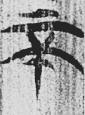不
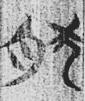{肉犬}（然）
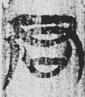君
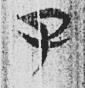子
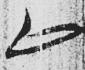㠯
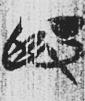○（賢）
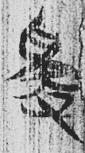爯（稱）
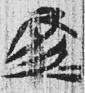害（曷）
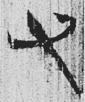又（有）
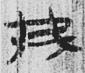弗
